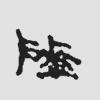陵
